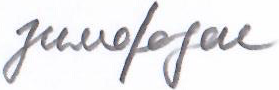зимородок
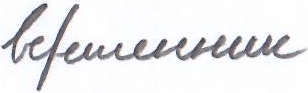веретенник
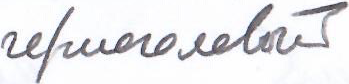черноголовый
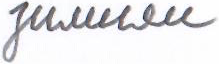зимняк
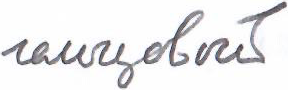гольцовый
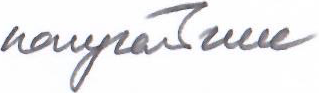попугайчик
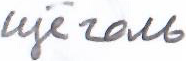щёголь
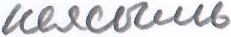неясыть
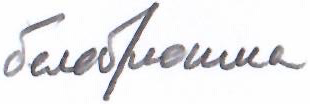белобрюшка
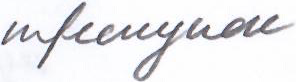трескунок
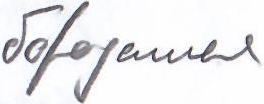бородатая
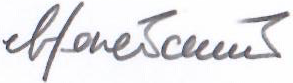европейский
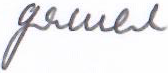дятел
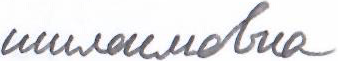шилоклювка
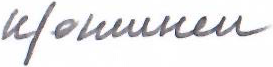кроншнеп
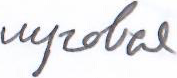луговая
